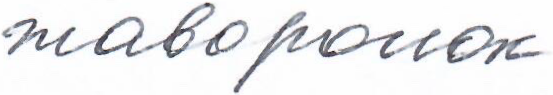жаворонок
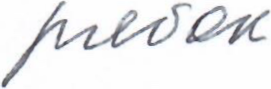рябок
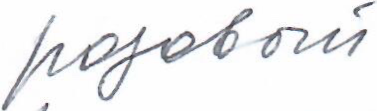розовый
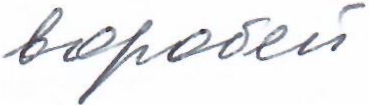воробей
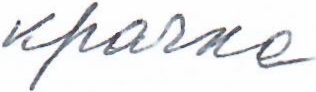крачка
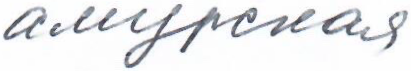амурская
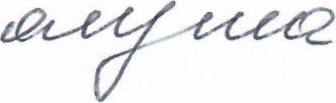олуша
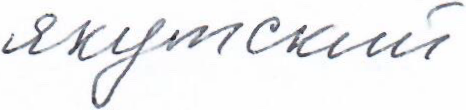якутский
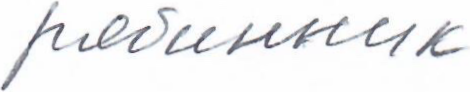рябинник
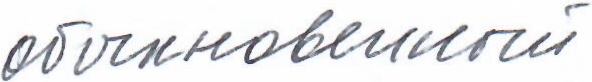обыкновенный
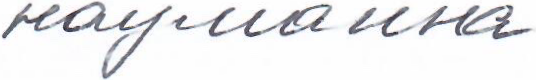науманна
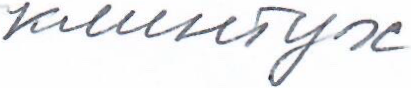клинтух
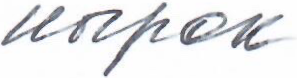нырок
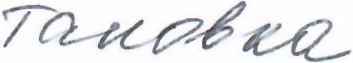таловка
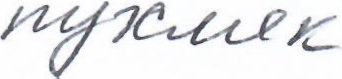пухляк
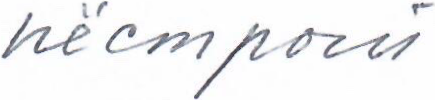пёстрый
